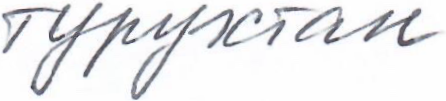турухтан
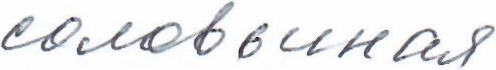соловьиная
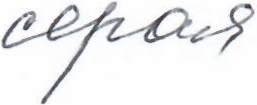серая
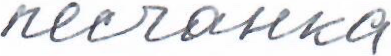песчанка
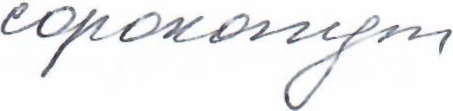сорокопут
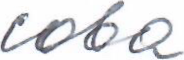сова
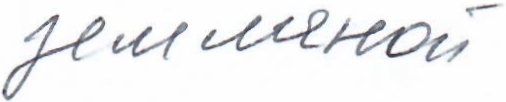земляной
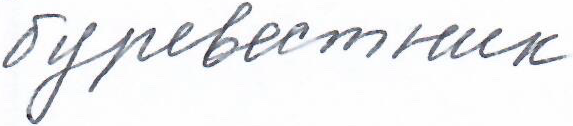буревестник
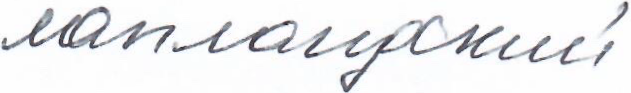лапландский
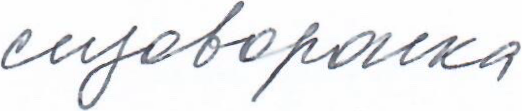сизоворонка
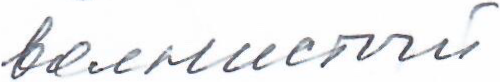волнистый
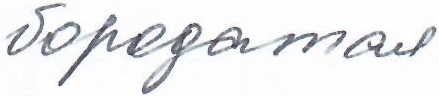бородатая
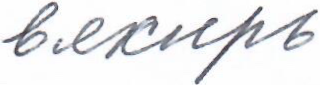вяхирь
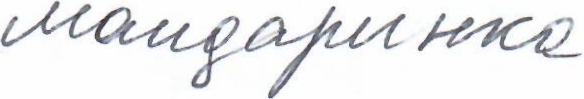мандаринка
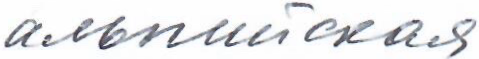альпийская
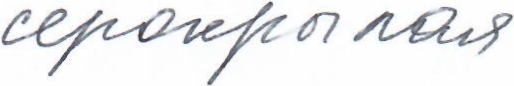серокрылая
